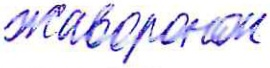жаворонок
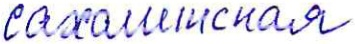сахалинская
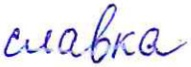славка
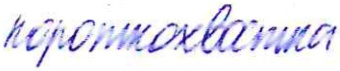короткохвостка
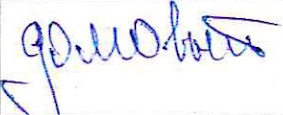домовый
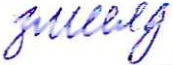змееяд
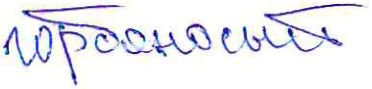горбоносый
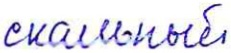скальный
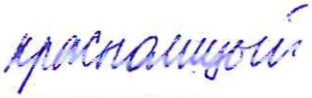краснолицый
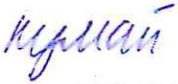кумай
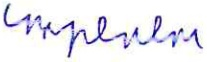стрепет
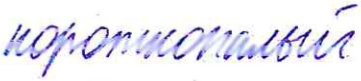короткопалый
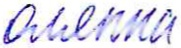оляпка
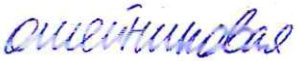ошейниковая
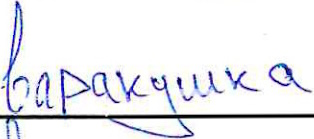варакушка
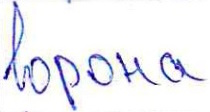ворона
